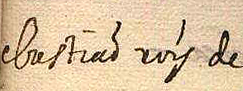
ebastiaõ roīs de
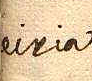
eiria
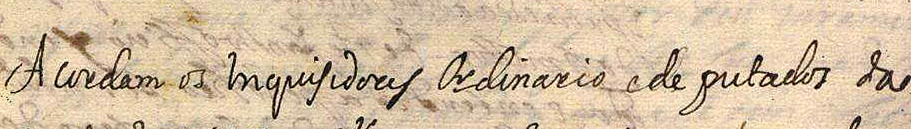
Acordam os Inquisidores Ordinario e deputados da
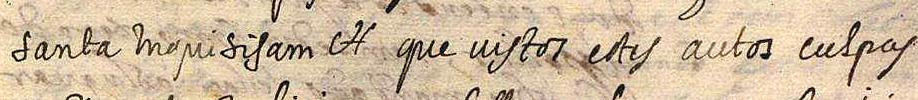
santa Inquisisam ett que uistos estes autos culpas
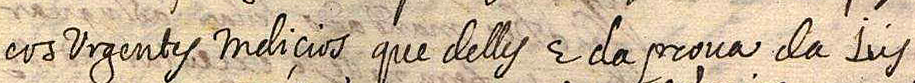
e os Vrgentes Indiçios que delles E da proua da Ius
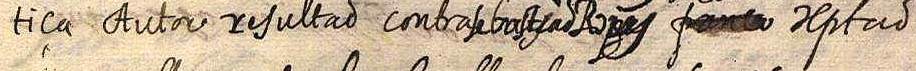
tiça Autor resultaõ contra sebastiaõ Rois̄ _ Xptaõ
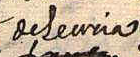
de Leuria
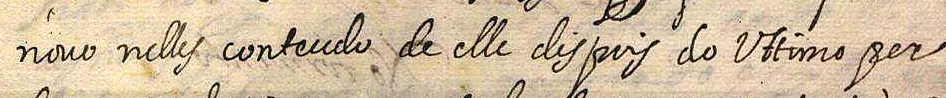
nouo nelles conteudo de elle dispois do Vltimo per
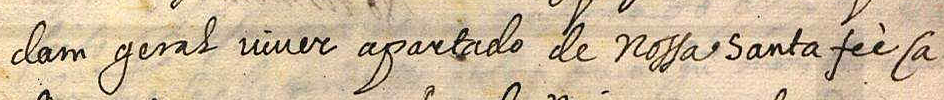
dam geral uiuer apartado de nossa santa feè Ca
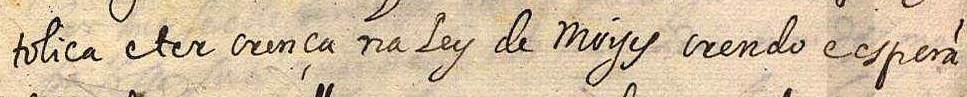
tolica e ter crença na Ley de moises crendo e esperā
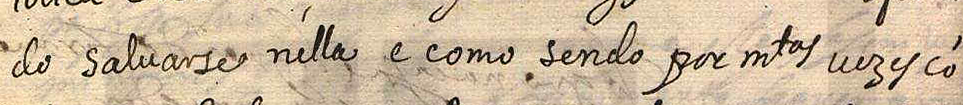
do saluarse nella e como sendo por mtas uezes cō
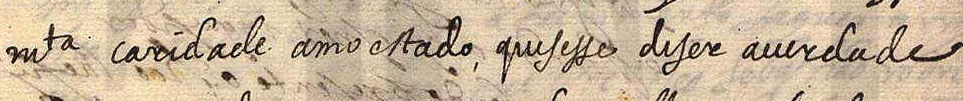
mta caridade amoestado, quisesse diser a uerdade
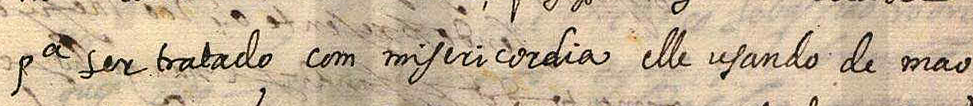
pa ser tratado com misericordia elle usando de mao
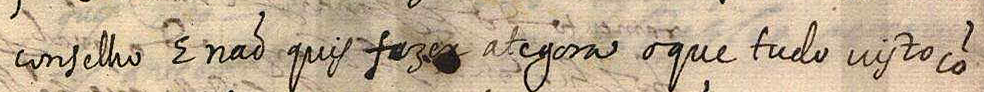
conselho E naõ quis fazer ate gora o que tudo uisto cō
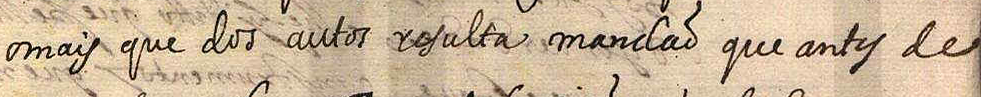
o mais que dos autos resulta mandaõ que antes de
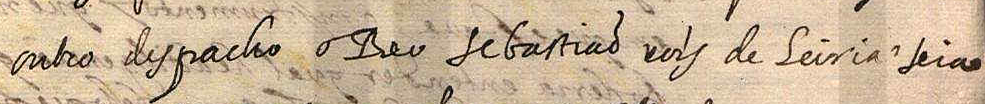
outro despacho o Reo sebastiaõ roīs de Leiria seia
